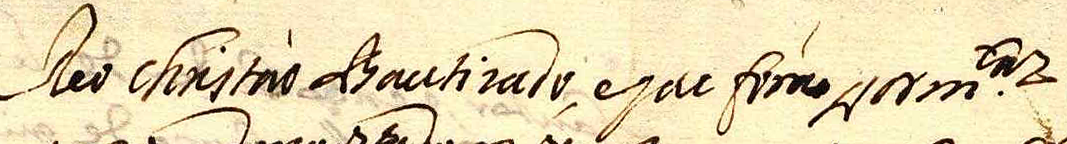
Reo christaõ Bautizado, e que forão por m.tas
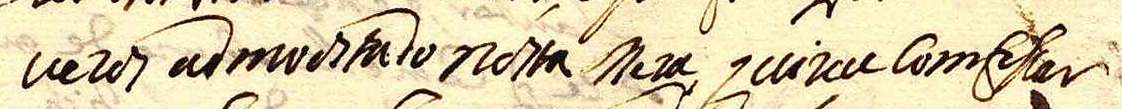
uezes admoestado nesta Meza, quizeçe comfessar
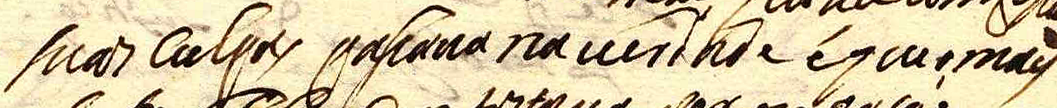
suas culpas passaua na uerdade é que o mais
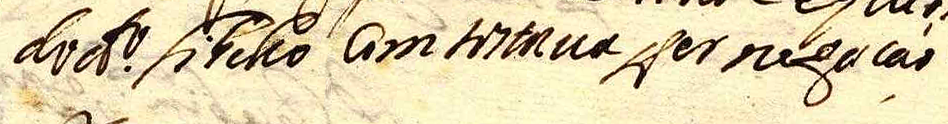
do d̄.o Libelo comtestaua por negaçaõ.
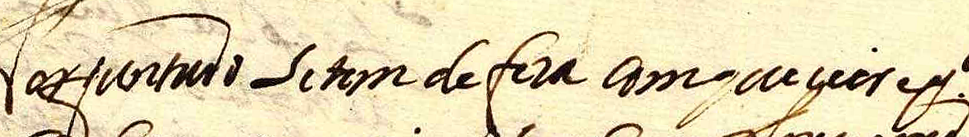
Perguntado se tem defeza com que uir e pa.
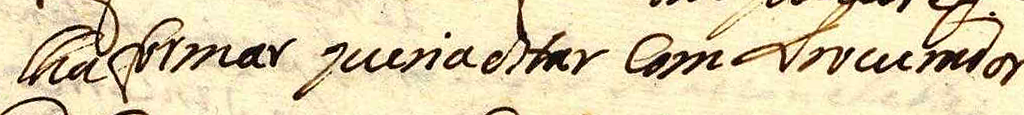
lha formar queria estar com o Procurador
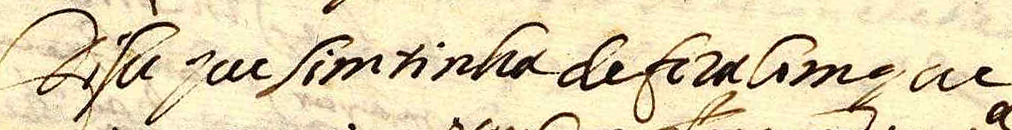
Disse que sim tinha defeza Com que
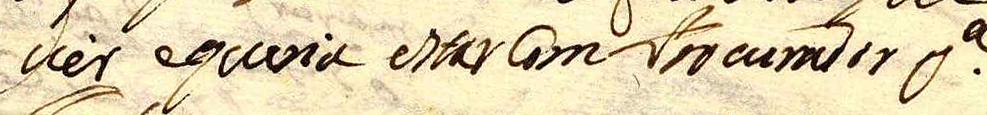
uir e queria estar com Procurador p.a
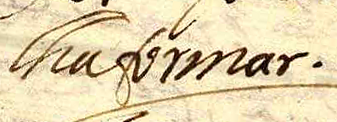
lha formar.
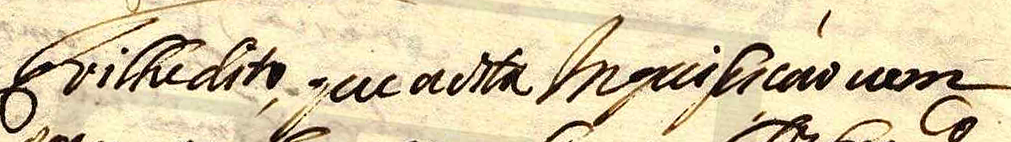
Foilhe dito, que a esta Inquisiçaõ uem
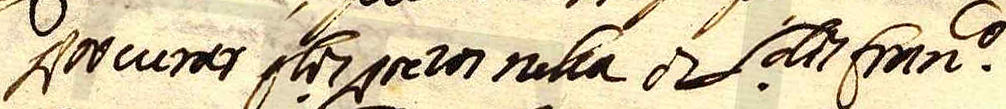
procurar plos prezos nella os L.dos fran.co
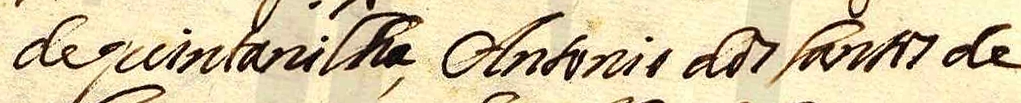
de quintanilha, Antonio dos santos de
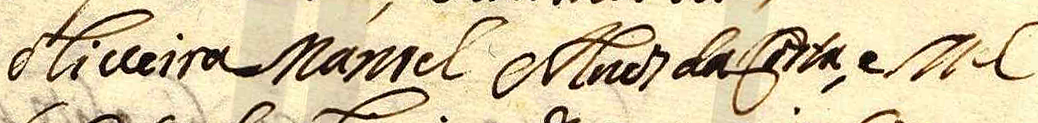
oliueira Manoel Alues da Costa, e Mel
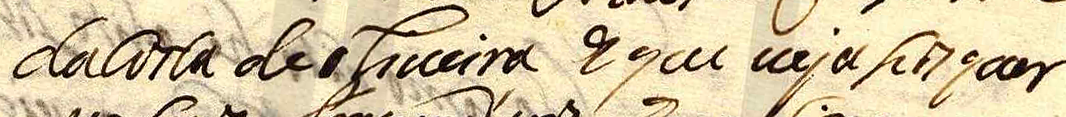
da costa de oliueira E que ueja se os quer
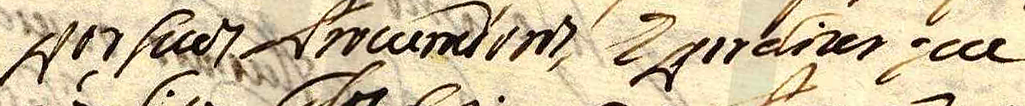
por seos Procuradores, E por dizer que
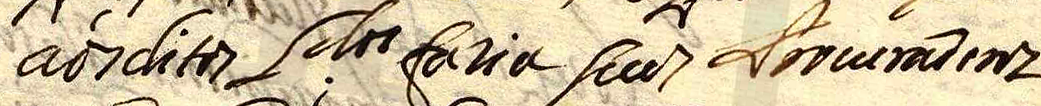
aós ditos L.dos fazia seos Procuradores
